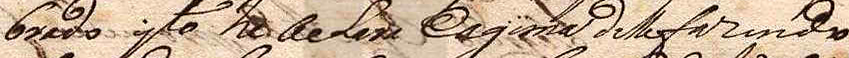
brado isto he a cLara e a gema delle fazendo
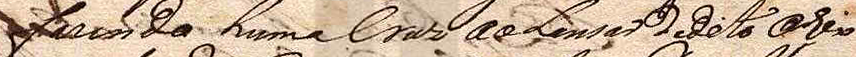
fazendo huma Cruz ao Lansar de dito Ovo
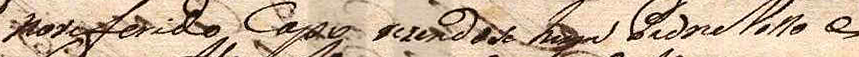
no referido Copo rezendose hum Padre Nosso e
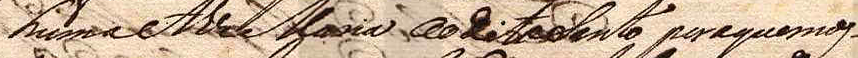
huma Ave Maria ao dito Santo pera que mos
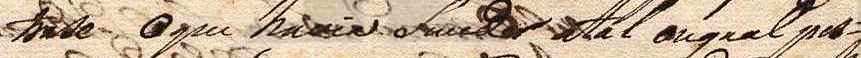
trase o que havia suceder tal ou qual pes
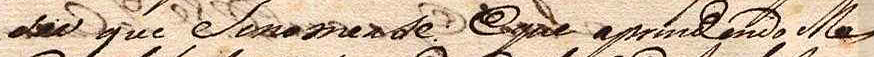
soa que se nomease e que aprendendo ella
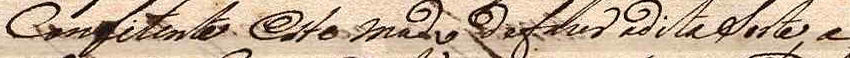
Confitente este modo de fazer a dita Sorte, a
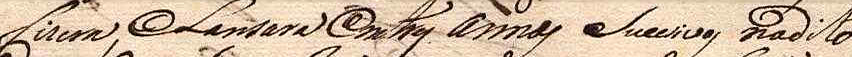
fizera, e Lansara em tres annos sucesivos no dito
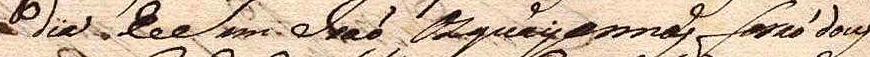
dia de Sam Ioaõ Oz quais annos foraõ dous
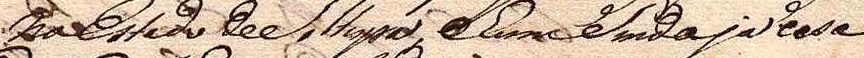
no Estado de Solteyra, e hum sendo ja casa
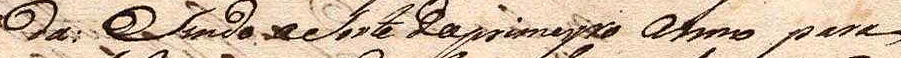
da: Sendo a sorte do primeyro anno para
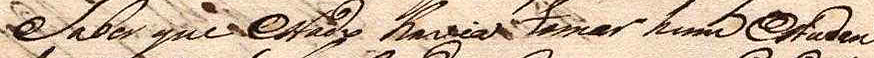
Saber que estado havia tomar hum estudan
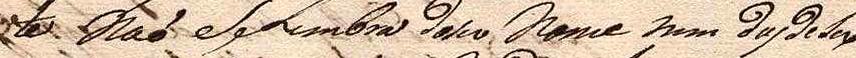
te naõ se Lembra do seu nome nem dos de seu
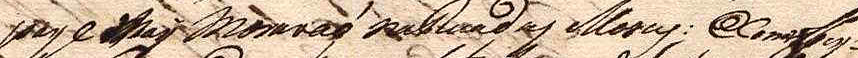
pay e May moravaõ na Rua das Merces: e com effey
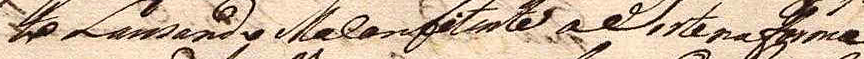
to Lansando ella confitente a Sorte na forma
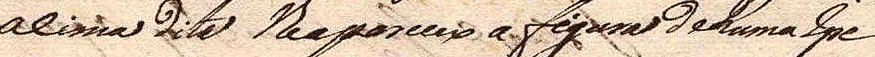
acima dita lhe apareceo a figura de huma Igre
